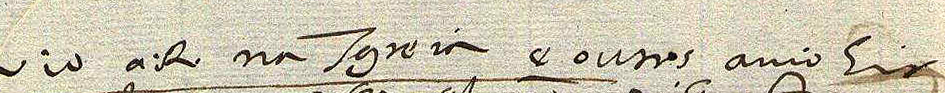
vio a .R. na Jgreia e outros a uio hir
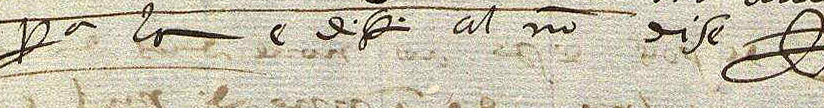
ꝑa la e deste al n̄o dise
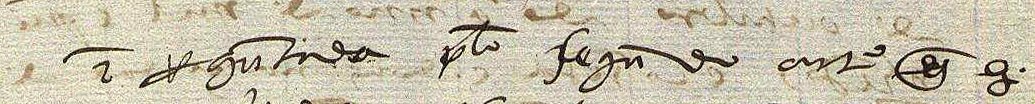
item ꝑgūtada p̄lo segūdo arto q̄ lhe
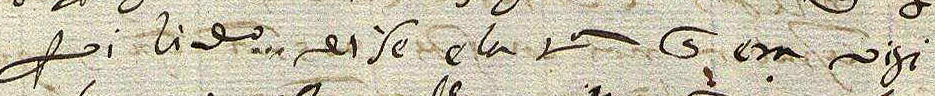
foi lido dise ela ta q̄ era visi
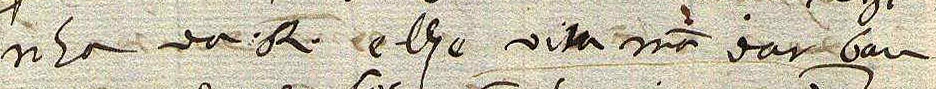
nha da .R. e lhe vira mādar bau
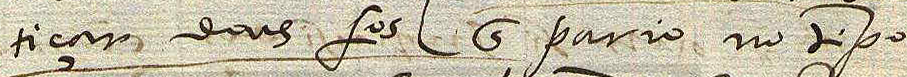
tiçar dous fos q̄ pario no tēpo
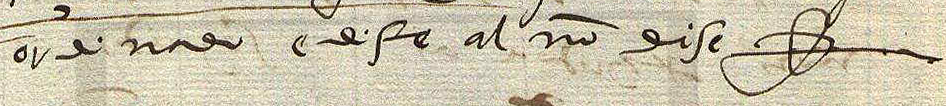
ordenado e deste al n̄o dise
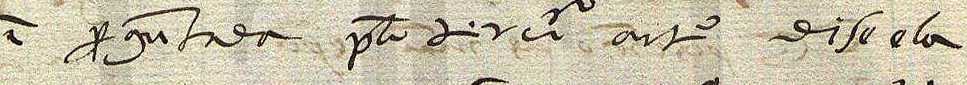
item ꝑḡutada p̄lo terço arto dise ella
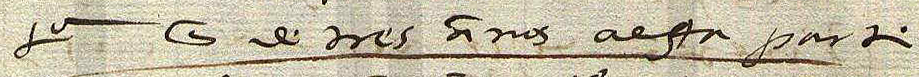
ta q̄ de tres anos a esta parte
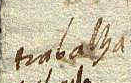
trabalha
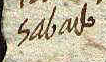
sabado
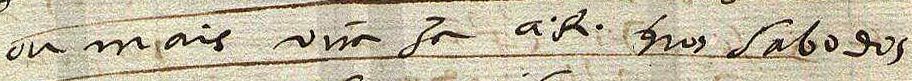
ou mais vira a .R. nos sabodos
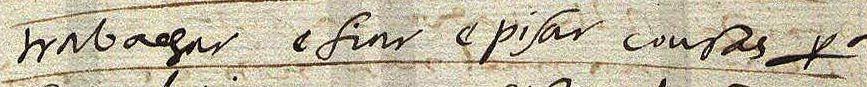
trabalhar e fiar e pisar cousas ꝑa
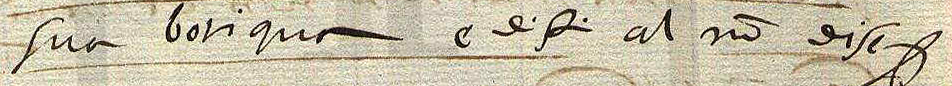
sua botiqua e deste al nō dise
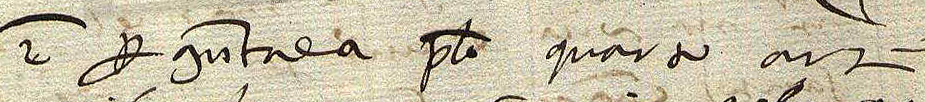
item ꝑgūtada p̄lo quarto arto
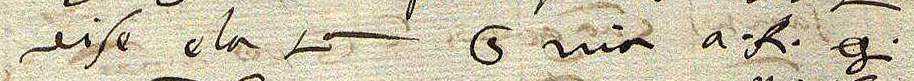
dise ela ta q̄ uia a .R. lhe
